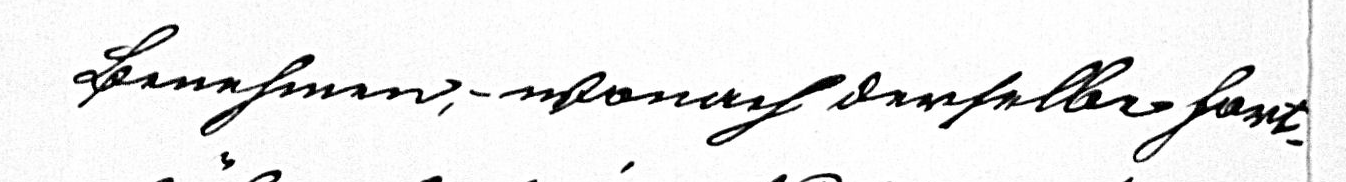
Benehmen, - wonach derselbe fort¬
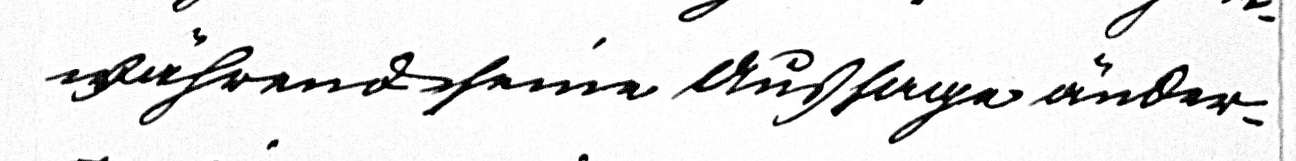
während seine Aussage änder¬
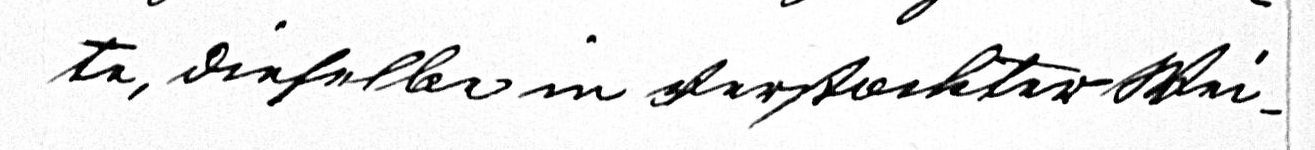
te, dieselbe in verstockter Wei¬
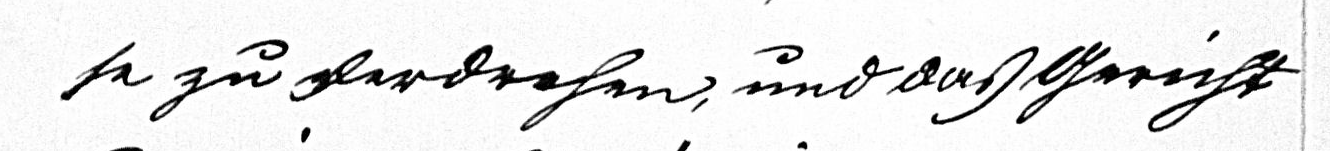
se zu verdrehen, und das Gericht
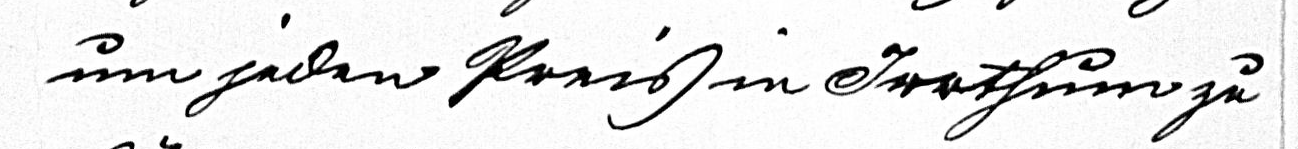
um jeden Preis in Irrthum zu
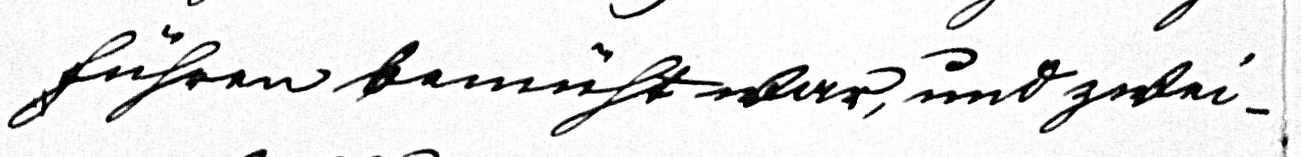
führen bemüht war, und zwei¬
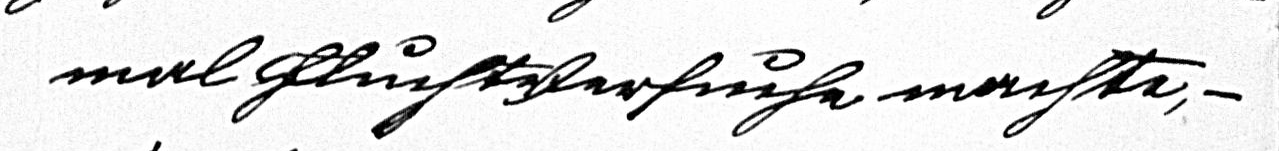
mal Fluchtversuche machte, -
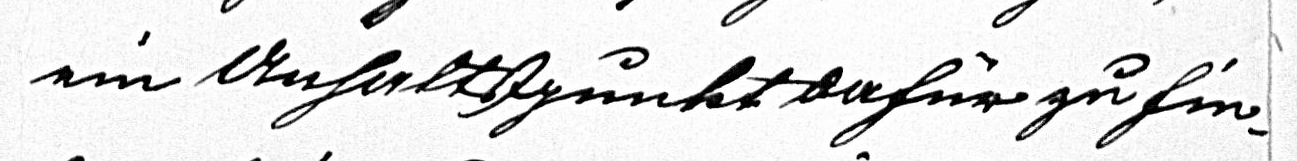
ein Anhaltspunkt dafür zu fin¬
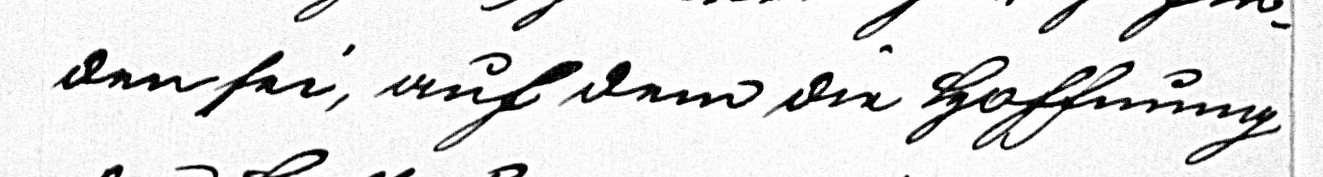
den sei, auf dem die Hoffnung
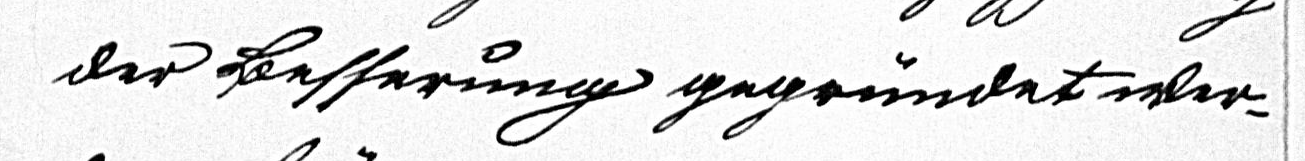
der Besserung gegründet wer¬
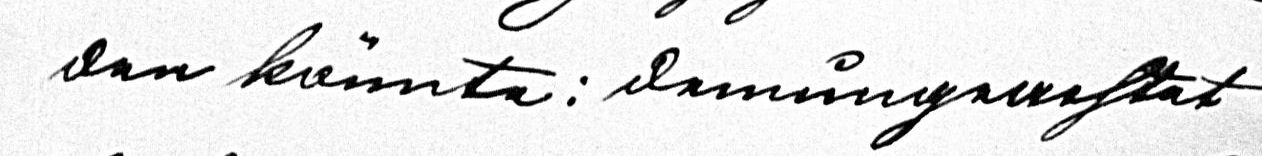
den könnte: demungeachtet
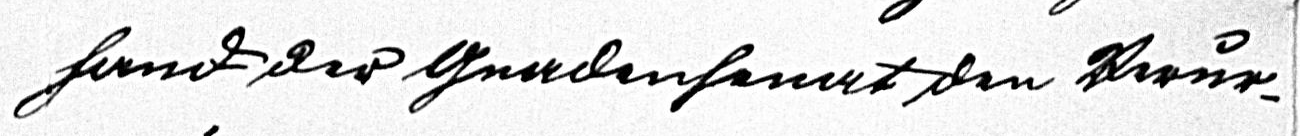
Hand der Gnadensenat den Verur¬
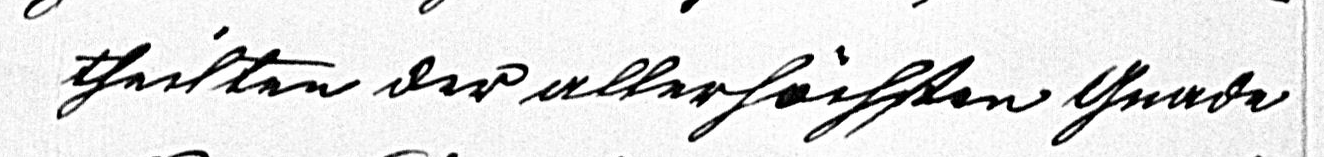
theilten der allerhöchsten Gnade
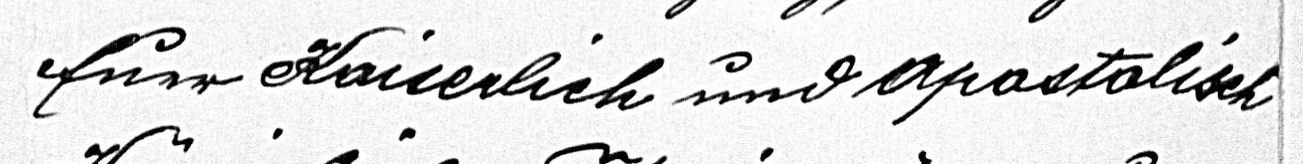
Euer Kaiserlich und Apostolisch
